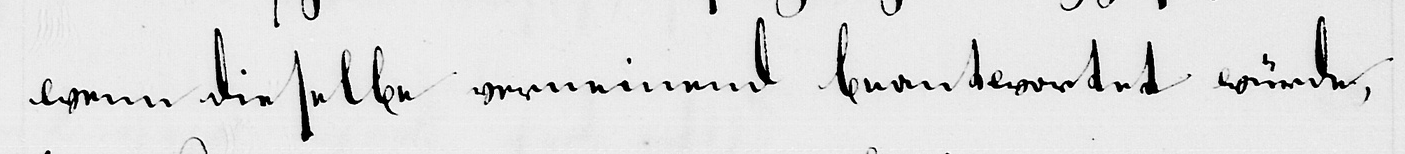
wenn dieselbe verneinend beantwortet würde,
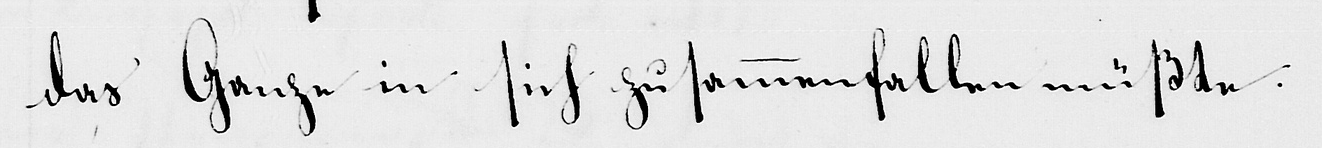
das Ganze in sich zusammenfallen müßte.
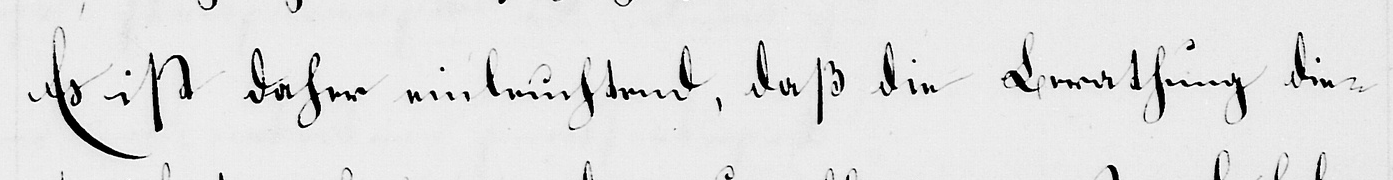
Es ist daher einleuchtend, daß die Berathung die¬
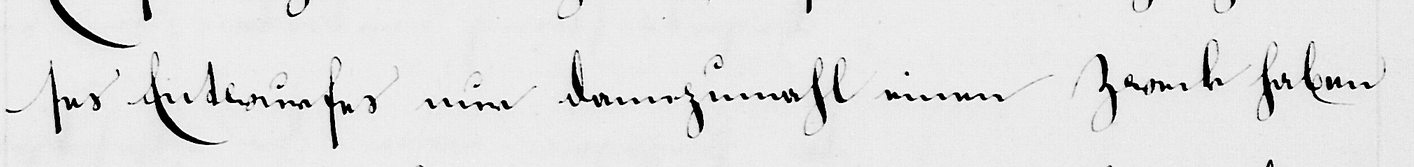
ses Entwurfes nur dannzumahl einen Zweck haben
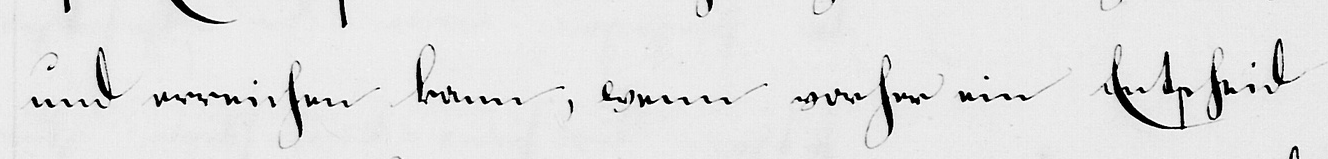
und erreichen kann, wenn vorher ein Entscheid
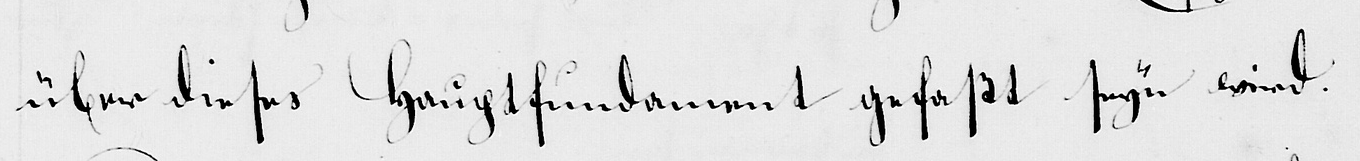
über dieses Hauptfundament gefasst seyn wird.
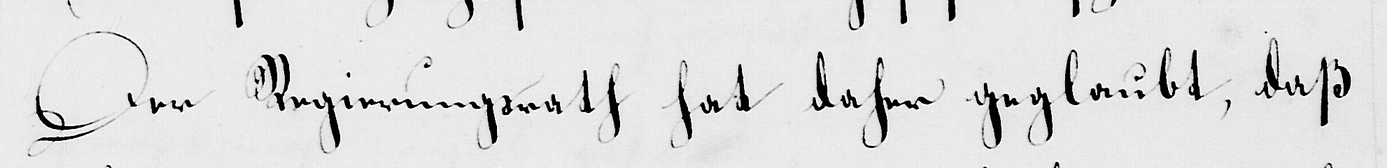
Der Regierungsrath hat daher geglaubt, daß
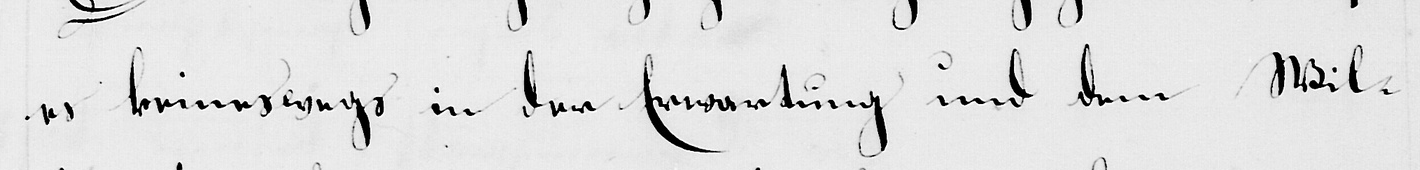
es keineswegs in der Erwartung und dem Wil¬
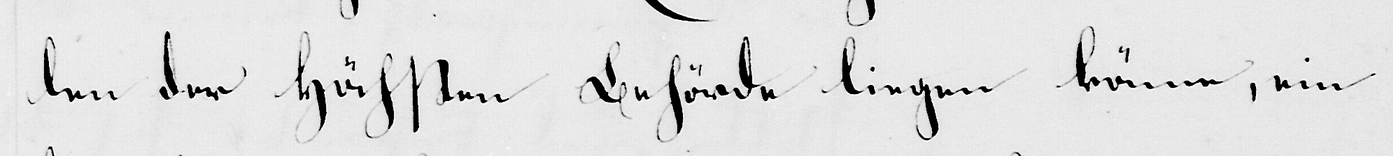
len der Höchsten Behörde liegen könne, ein
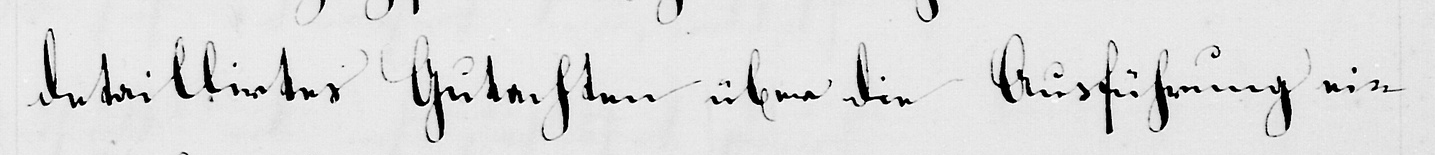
detaillirtes Gutachten über die Ausführung ein¬
